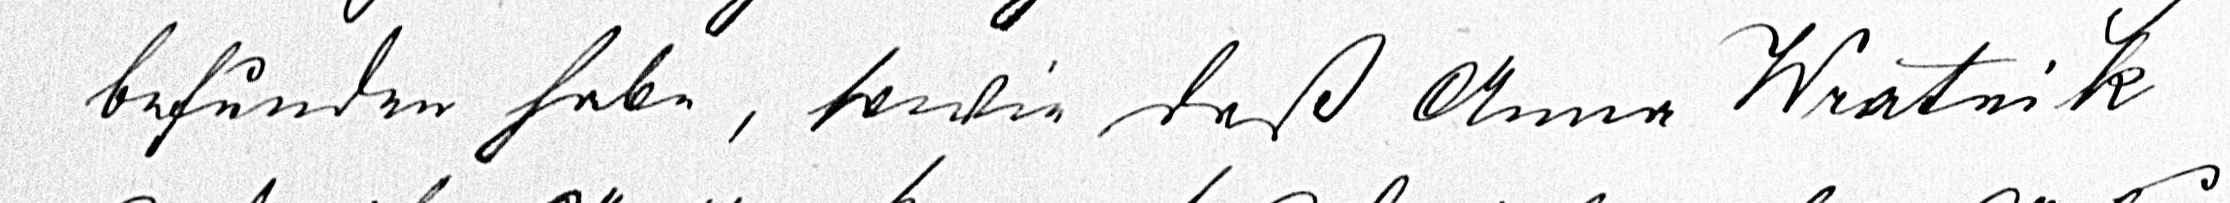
befunden habe, sowie daß Anna Wratnik
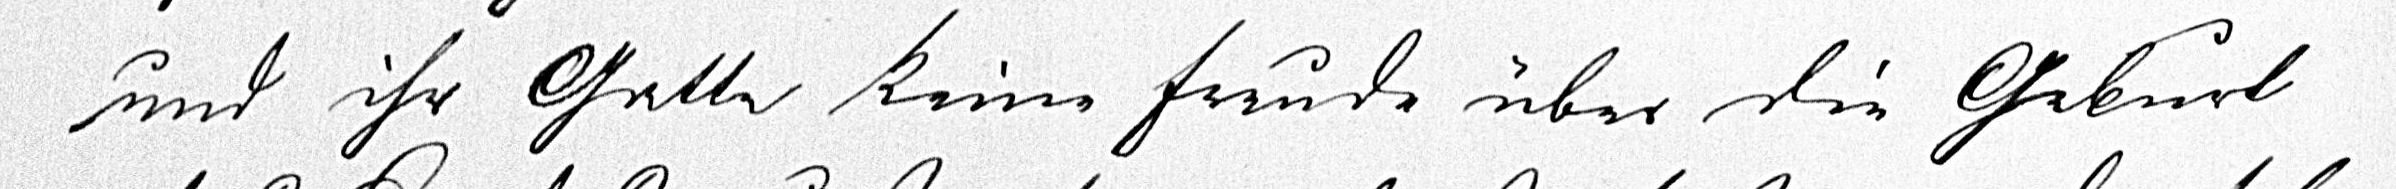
und ihr Gatte keine Freude über die Geburt
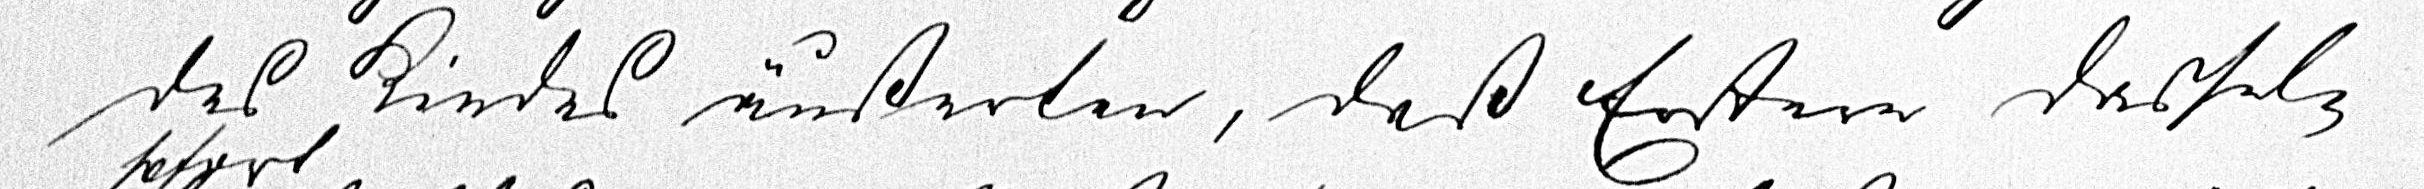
des Kindes äußerten, daß Ersten dassel¬
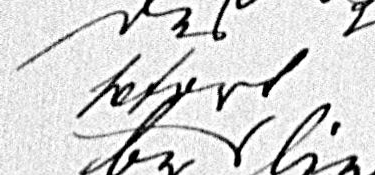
sofort
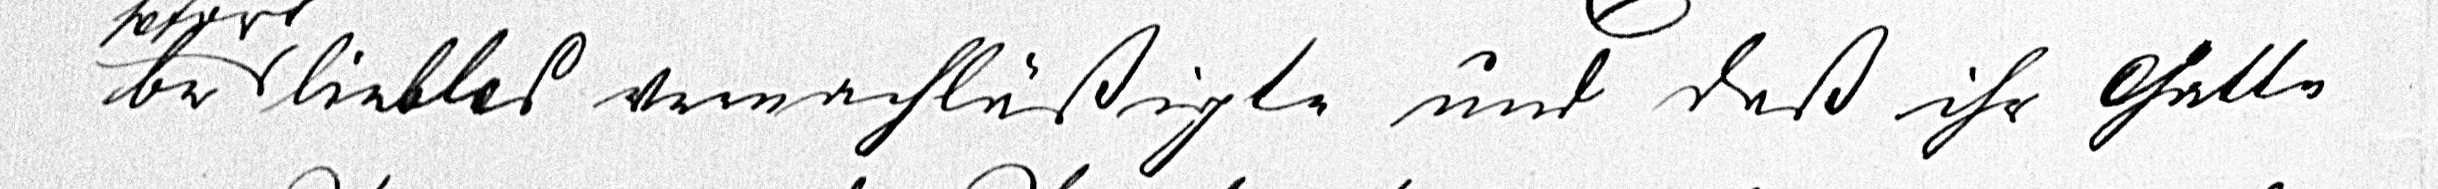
be liebtes vernachläßigte und daß ihr Gatte
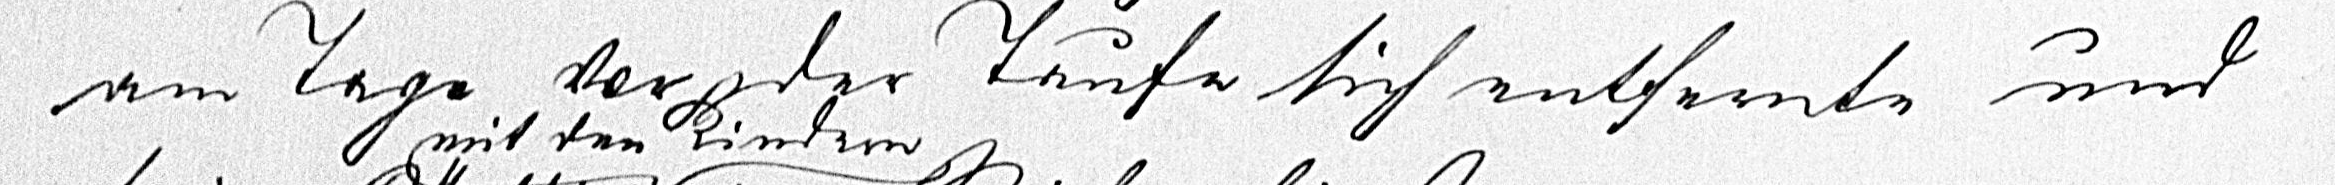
am Tage vor der Taufe sich entfernte und
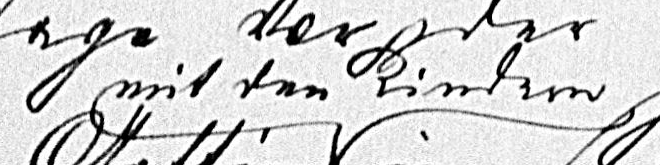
mit den Kindern
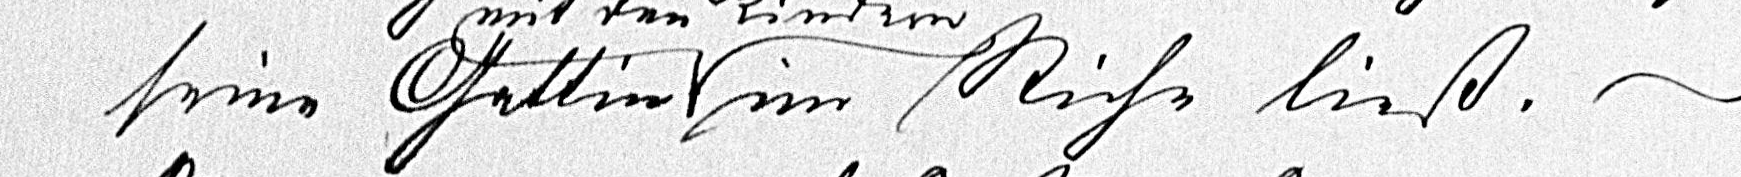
seine Gattin Stiche ließ.
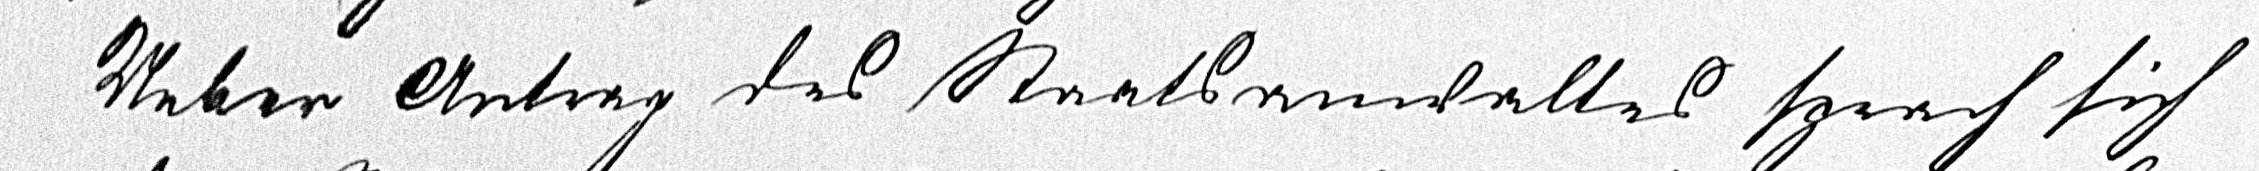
Ueber Antrag des Staatsanwaltes sprach sich
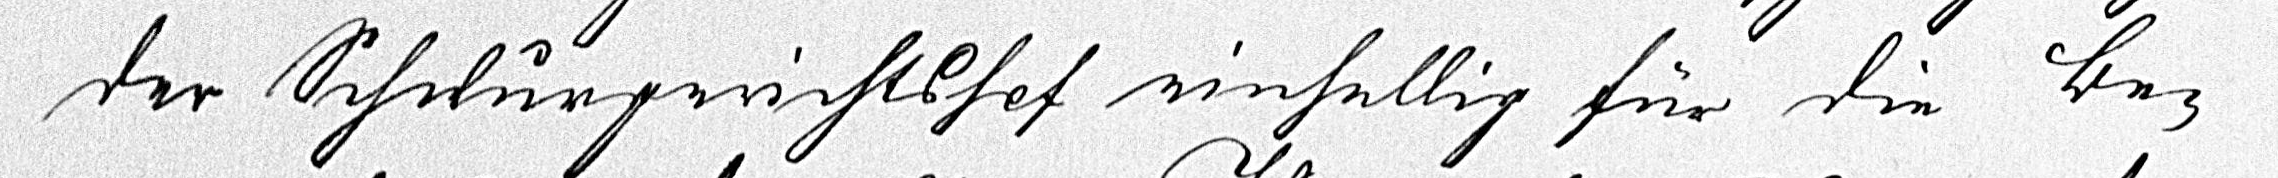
der Schwurgerichtshof einhellig für die Be¬
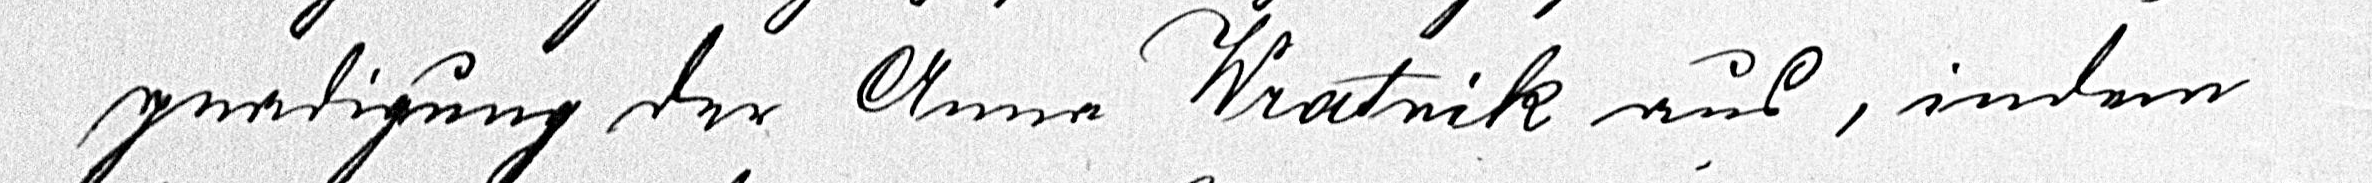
gnadigung der Anna Wratnik aus, indem
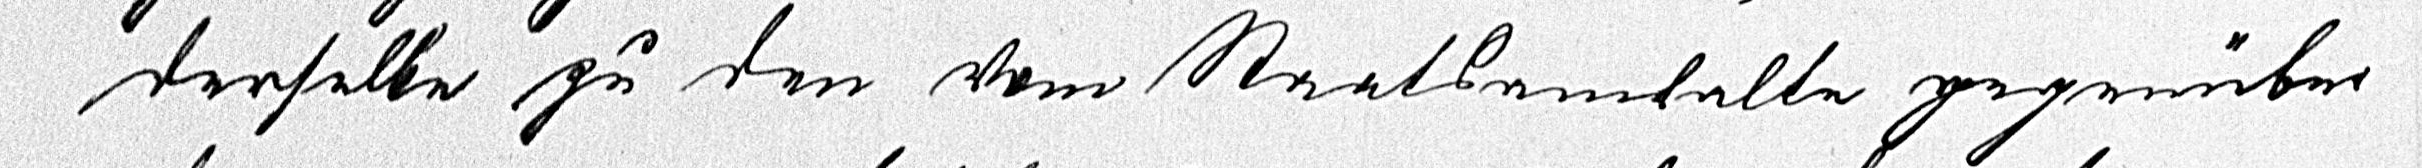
derselbe zu den vom Staatsamtalte gegenüber
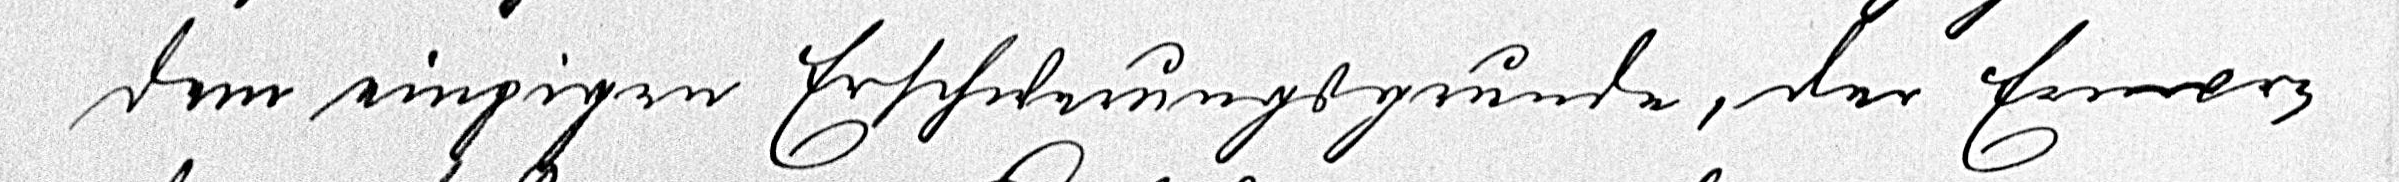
dem einzigen Erschwerungsgrunde, der Ermor¬
